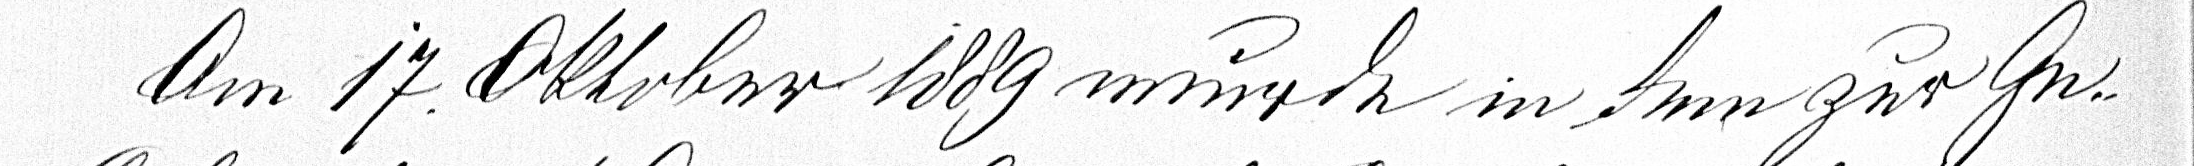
Am 17. Oktober 1889 wurde in dem zur Ge¬
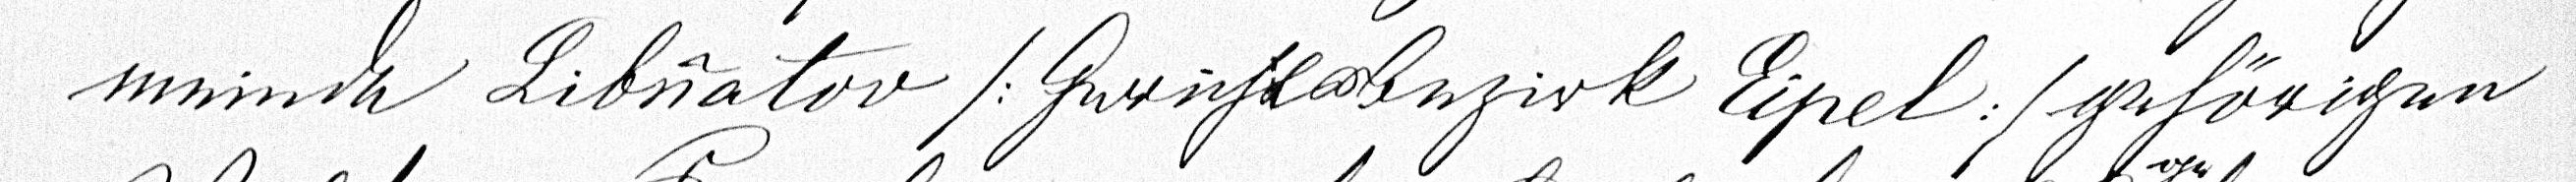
meinde Libxxatov /:Gerichsbezirk Eipel:/ gehörigen
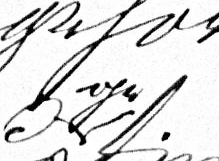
ge
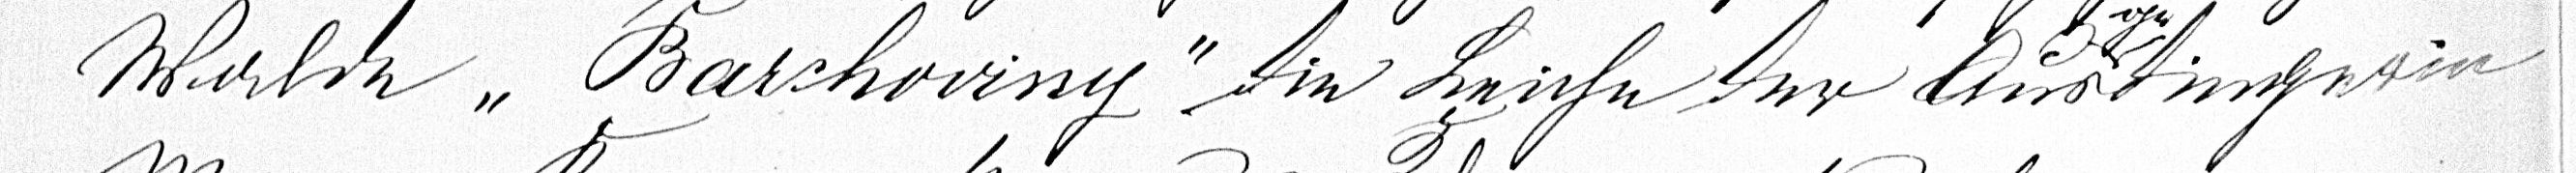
Walde „Barchoving" die Leiche der Ausdingerin
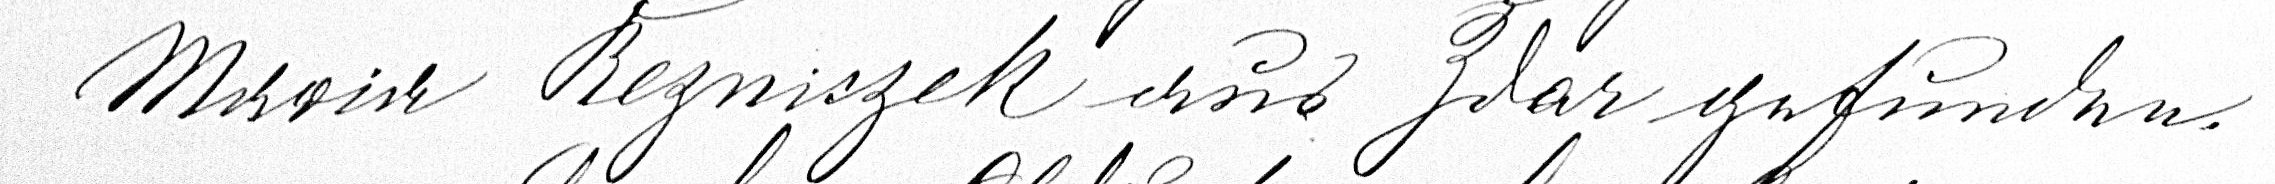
Maria Regniczek aus Zdar gefunden.
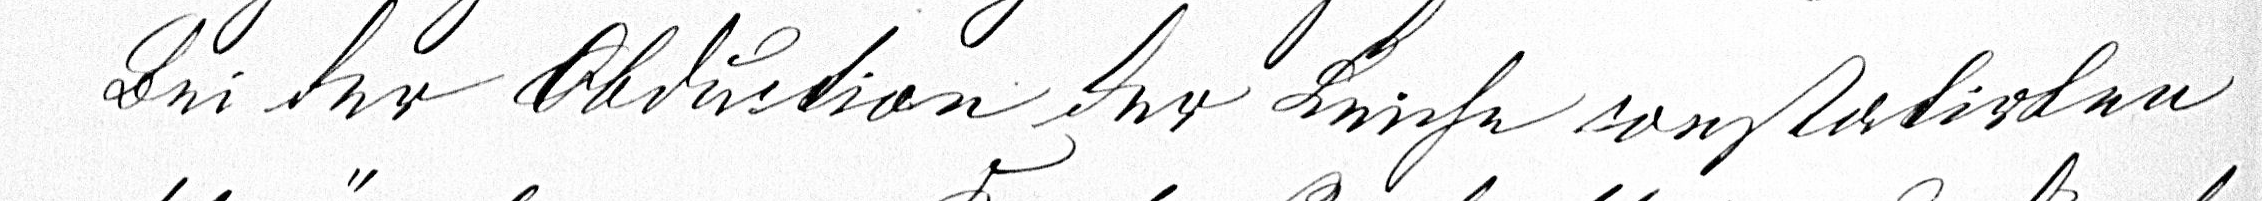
Bei der Obduction der Leiche constatirten
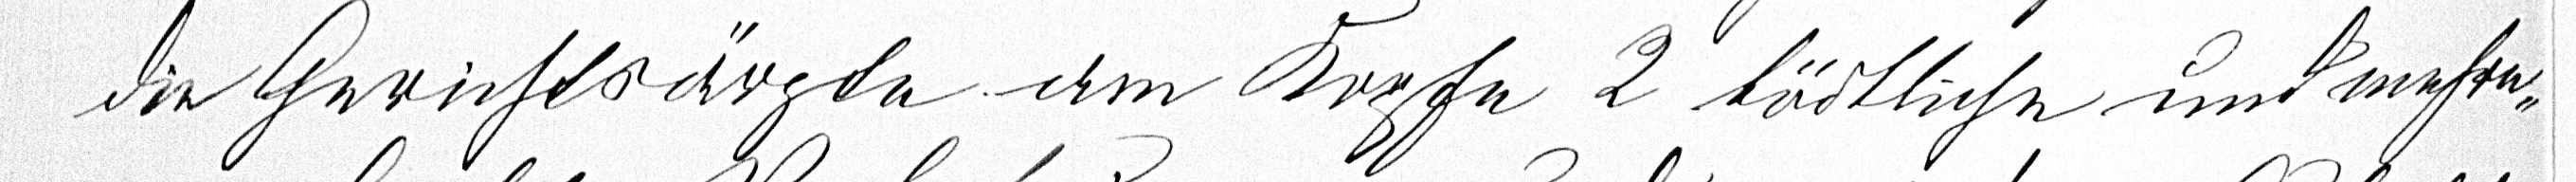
die Gerichtsärzte am Kopfe 2 tödtliche und mehre¬
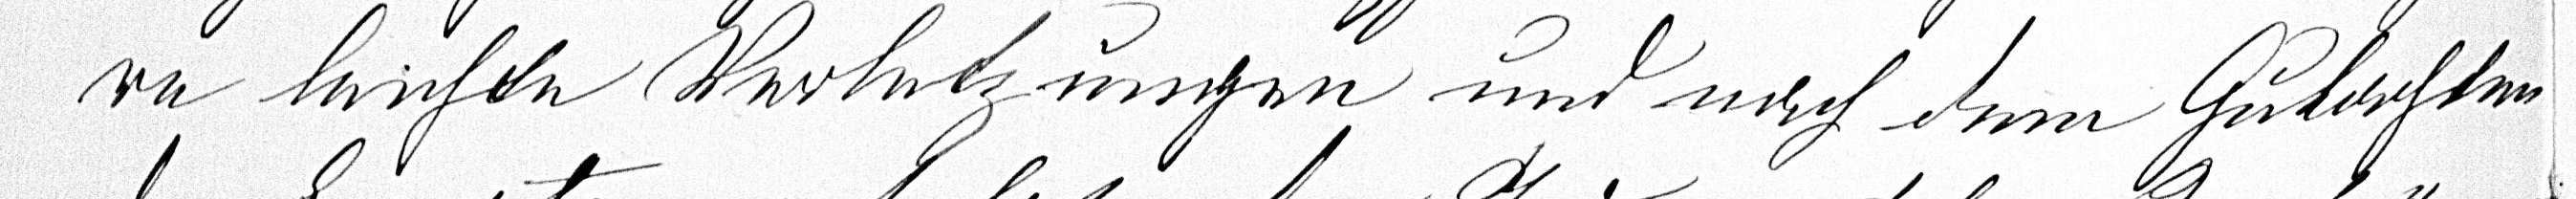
re leichte Verletzungen und nach dem Gudachten
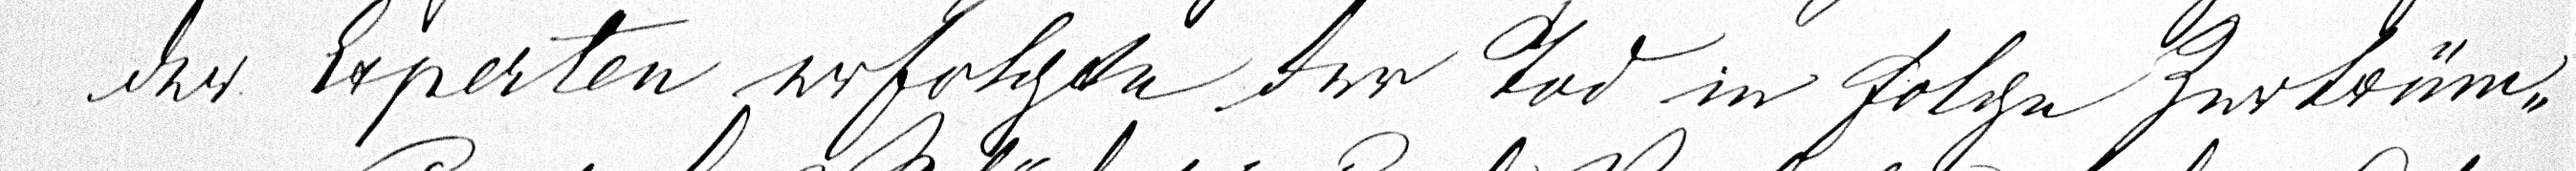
der Experten erfolgte der Tod in folge Zertrüm¬
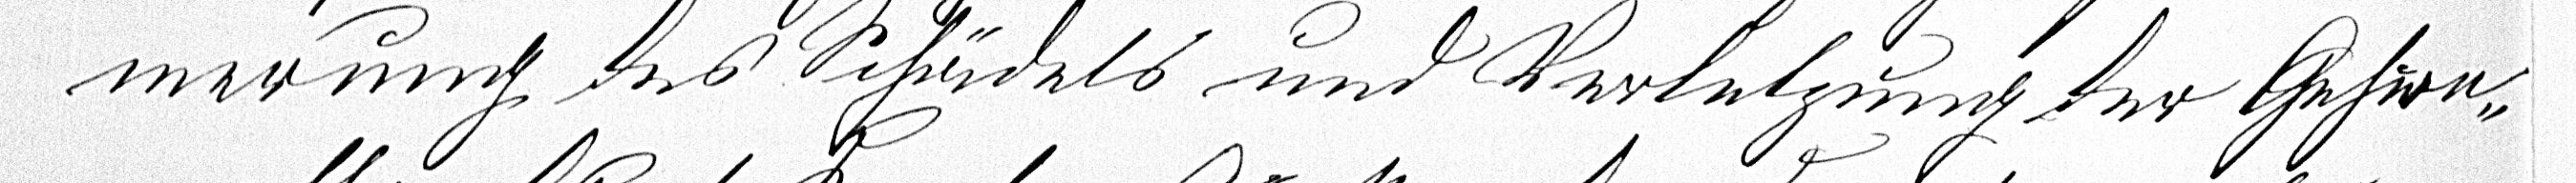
merung des Schädels und Verletzung der Gehxxe¬
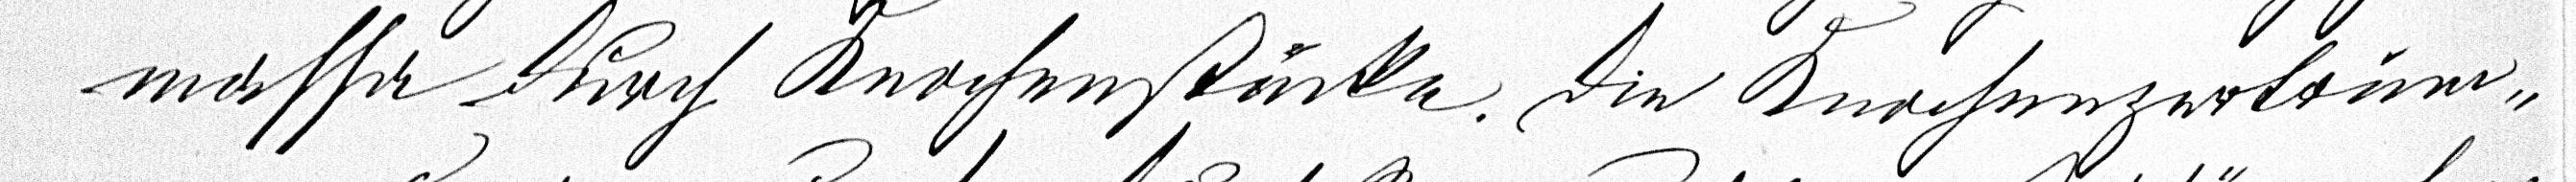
massa durch Kerchenstücke. Die Kerchenzerlxxm¬
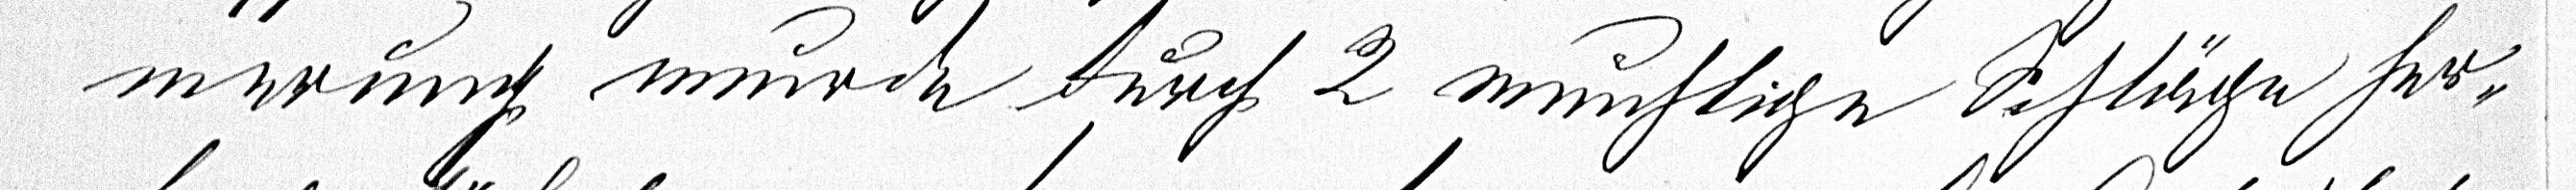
merung wurde durch 2 wuchtige Schläge her¬
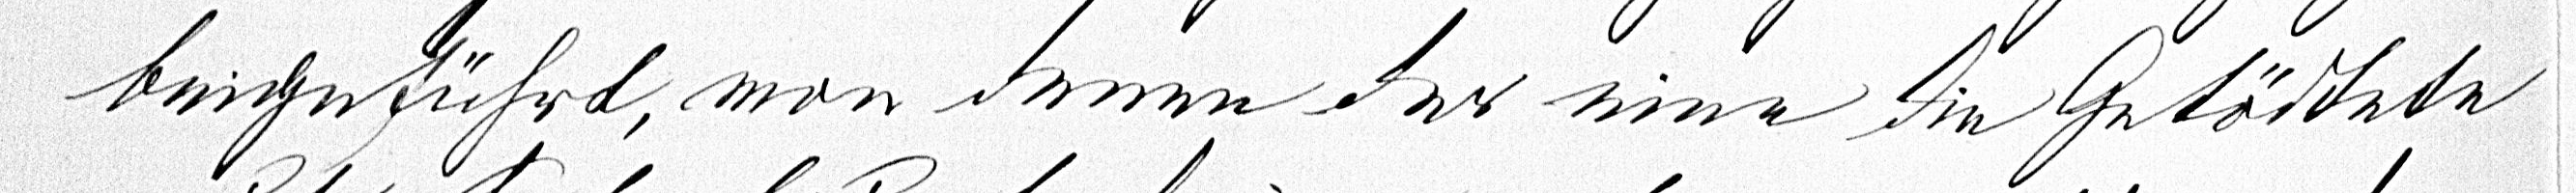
beigeführt, mon denen der eine die Getödtete
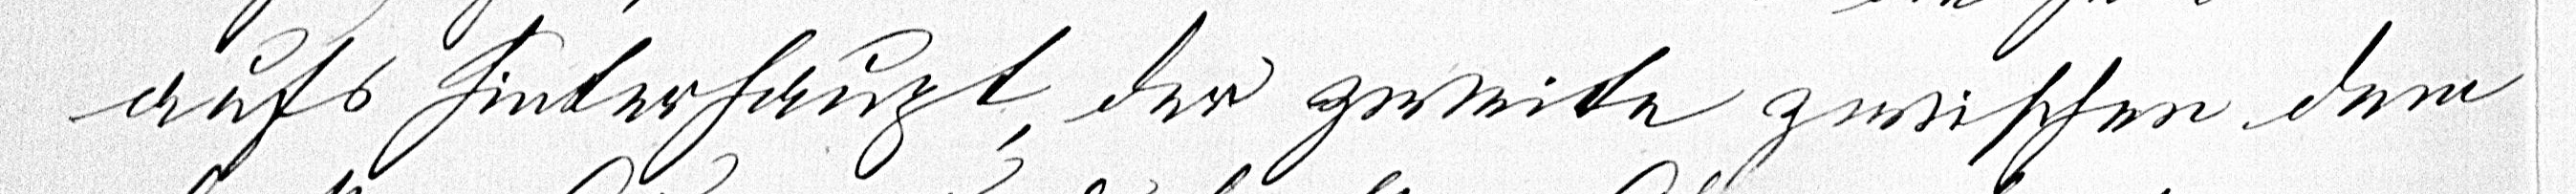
aufs Hinterhaupt, der zweite zwischen dem
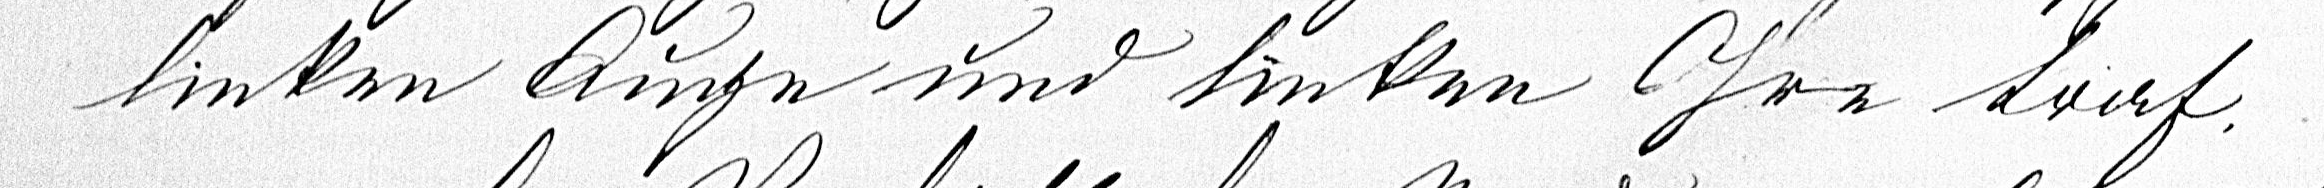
linken Auge und linken Ohre traf.
